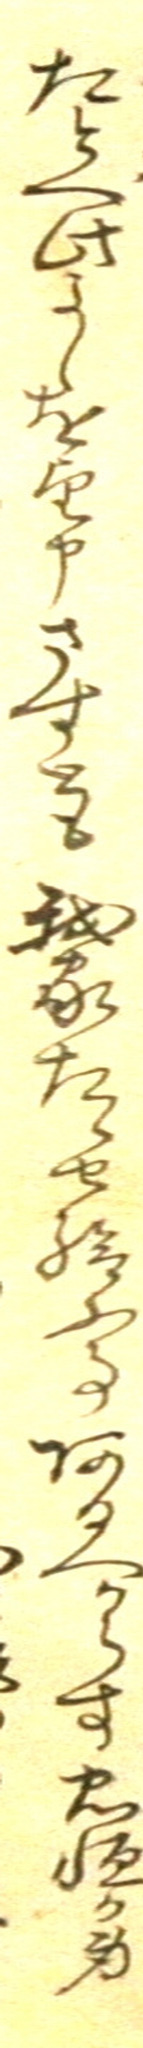たとへ此よしを望申さすとも我家たゝせ給ふ事あるへからす忠恒か身
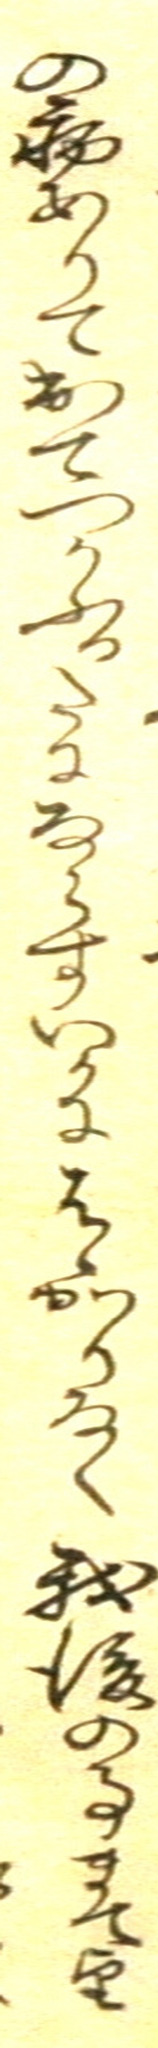の病ありて出てつかふるたにならすいかにはゝかりなく我後の事まて望
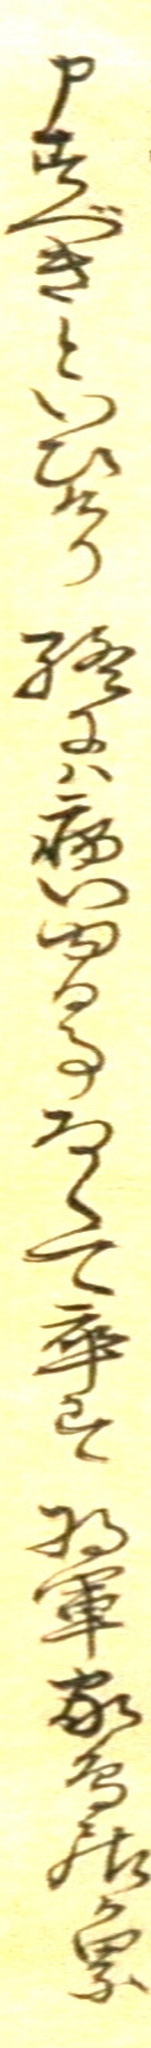申すべきといひけり終には病いゆる事なくて卒す将軍家鳥居か累

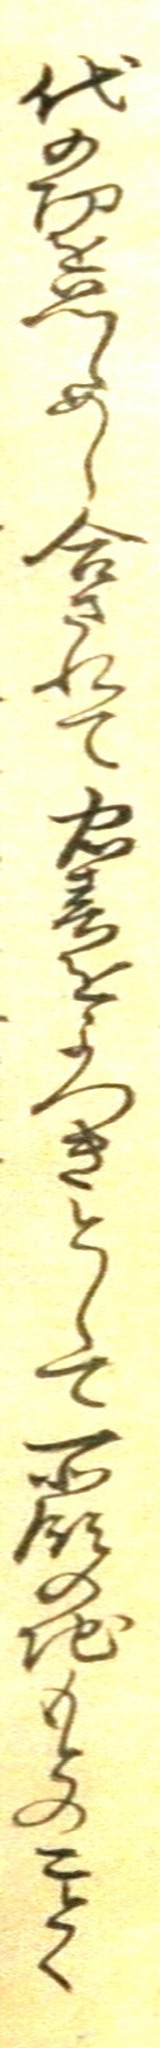代の功を思しめし合されて忠春をよつきとして所領の地もとのことく
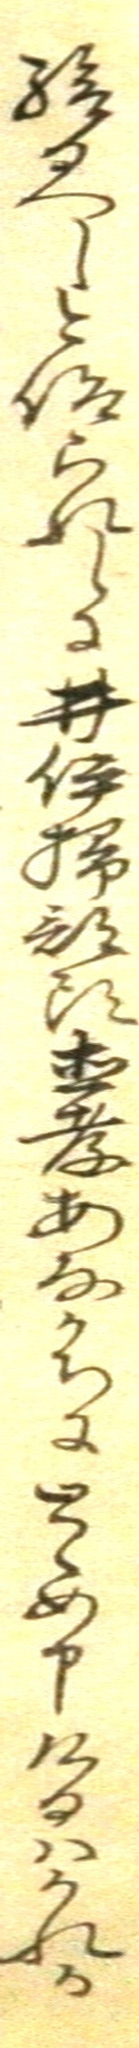給るへしと仰られしに井伊掃部頭直孝あなかちにとゝめ申けるはかれか
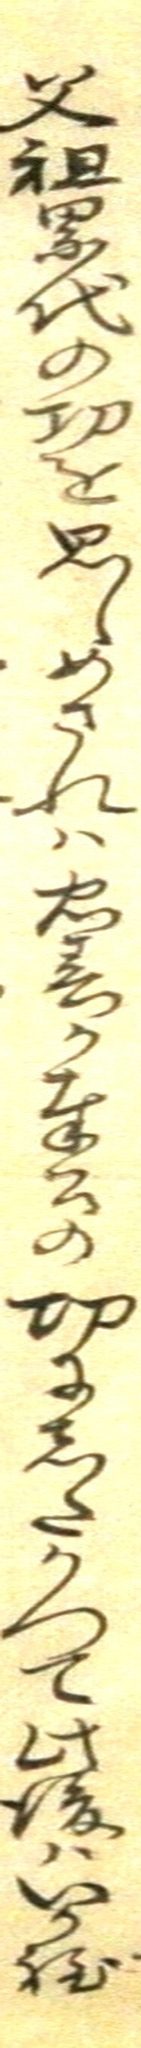父祖累代の功を思しめされは忠春か奉公の功にしたかつて此後はいか程
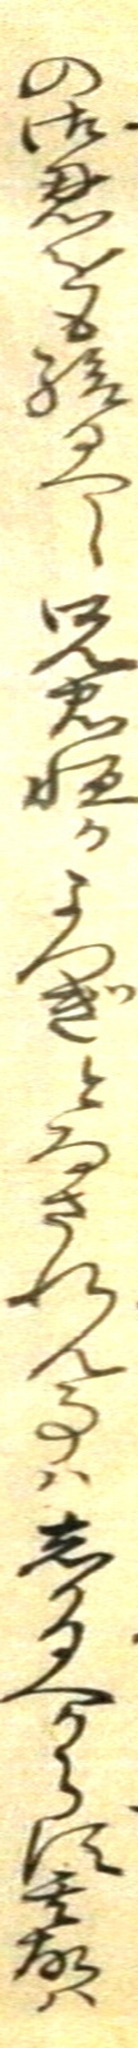の御恩をも給るへし兄忠恒かよつぎとなされん事はしかるへからす其故は
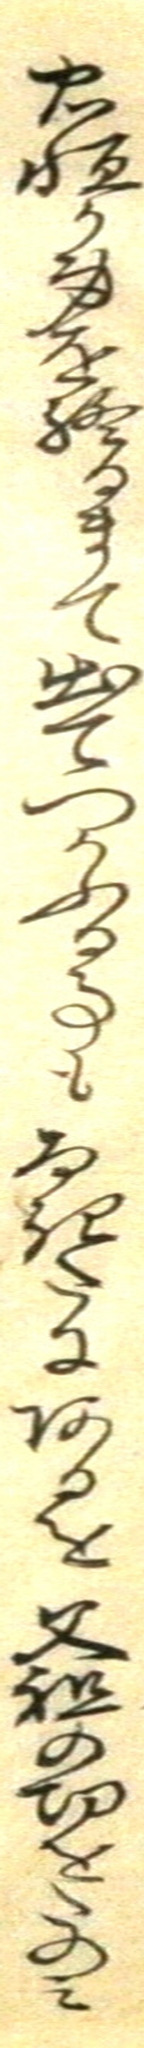忠恒か身を終るまて出てつかふる事もなきたにあるを父祖の功をたのみ
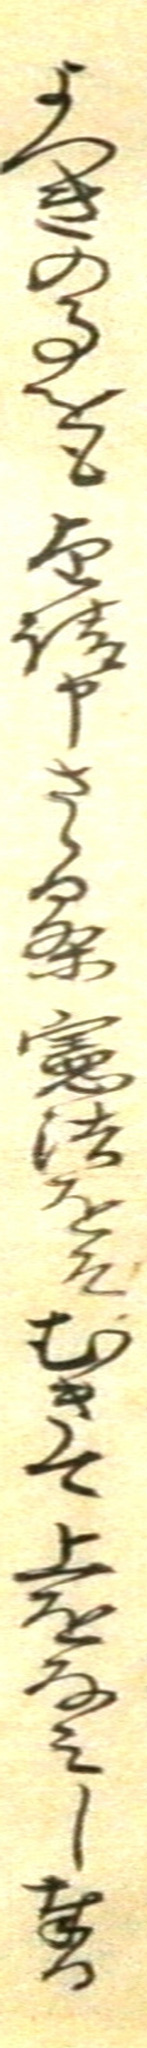よつきの事をも望請申さゝる条憲法をそむきて上をなみし奉る
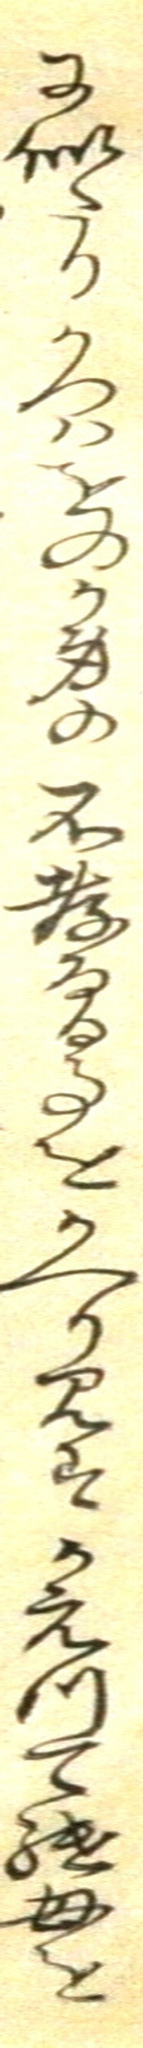に似たりかつはをのか身の不孝なることをかへり見すかえつて継母を
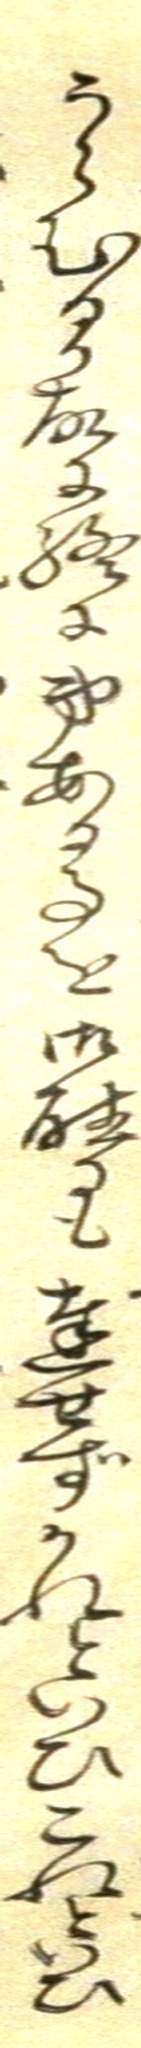うらむるか故に終に弟ある事を御聴にも達せずかれといひこれといひ
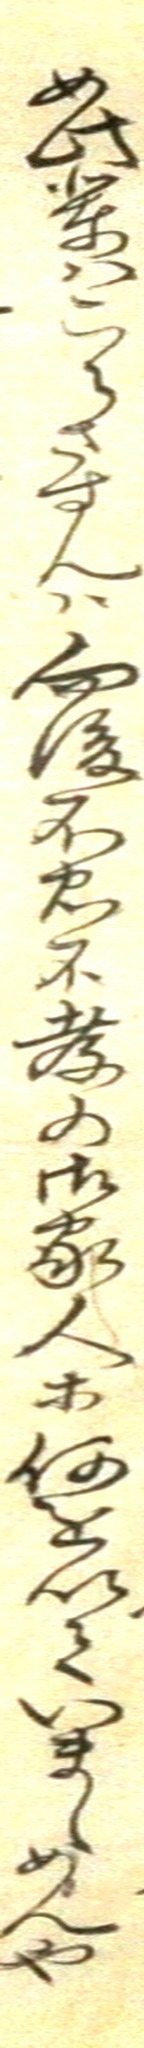如此輩はこらさすんは向後不忠不孝の御家人等何を以ていましめんや
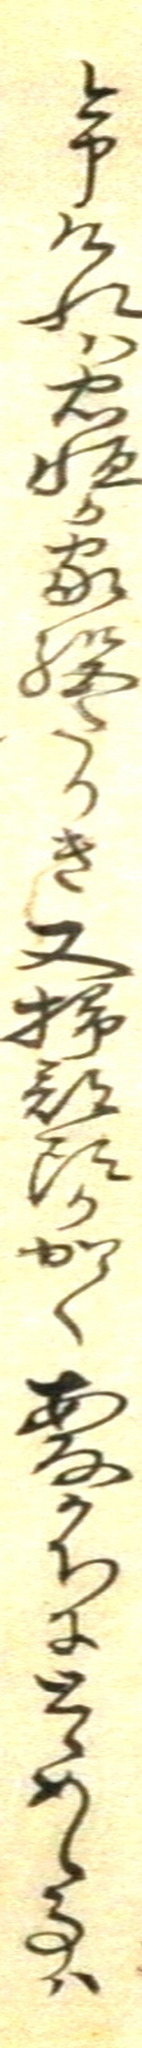と申けれは忠恒か家絶たりき又掃部頭かかくあなかちにとゝめし事は
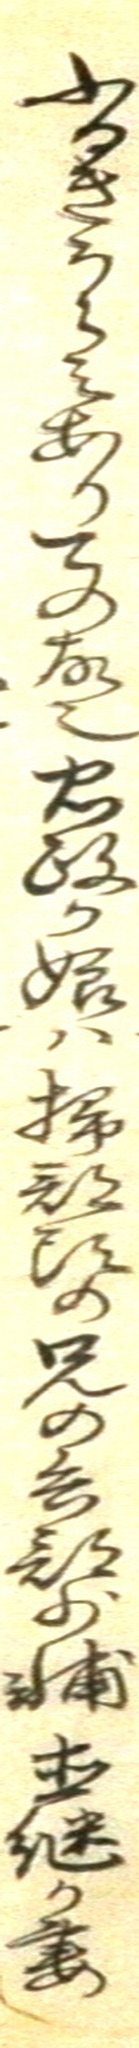ふるきうらみありての故也忠政か娘は掃部頭の兄の兵部少輔直継か妻
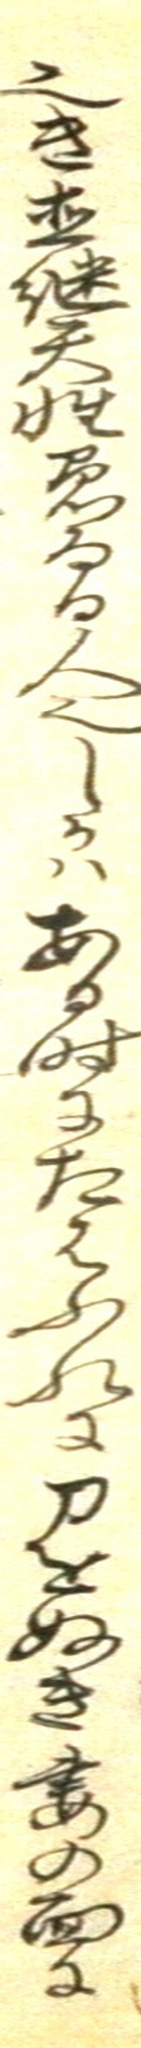也き直継天性愚なる人也しかはある時にたはふれに刀をぬき妻の面に
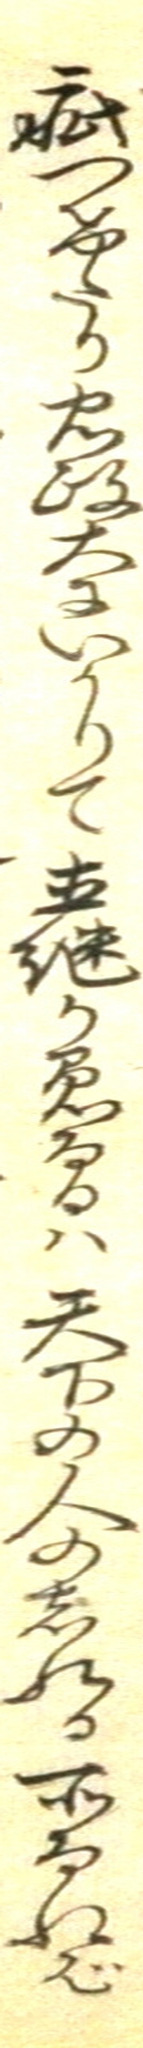疵つけたり忠政大にいかりて直継か愚なるは天下の人のしれる所なれば
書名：藩翰譜（四・中）
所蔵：伊那市立高遠町図書館・合同会社AMANE
